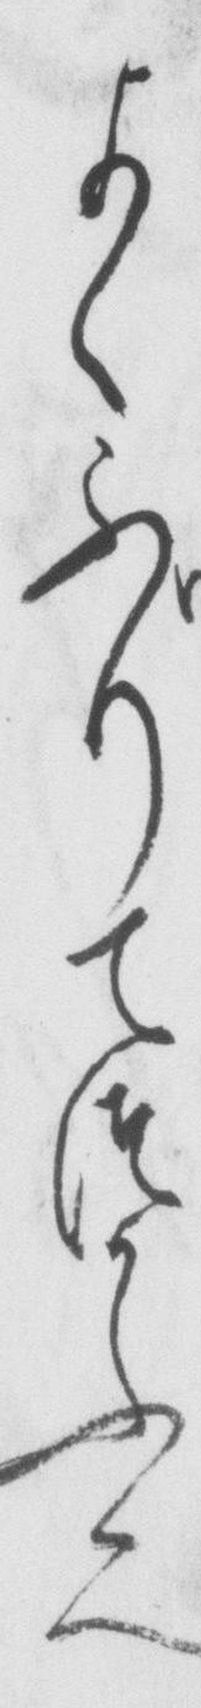よくふりてつかふ也
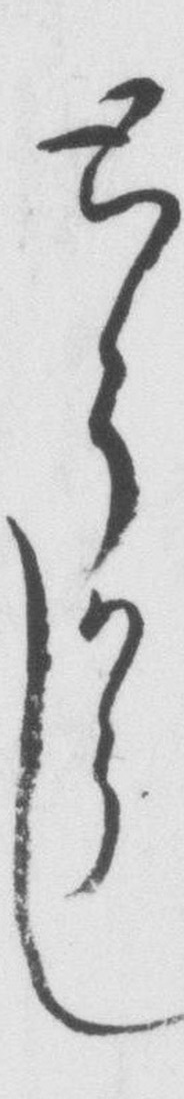とうからし
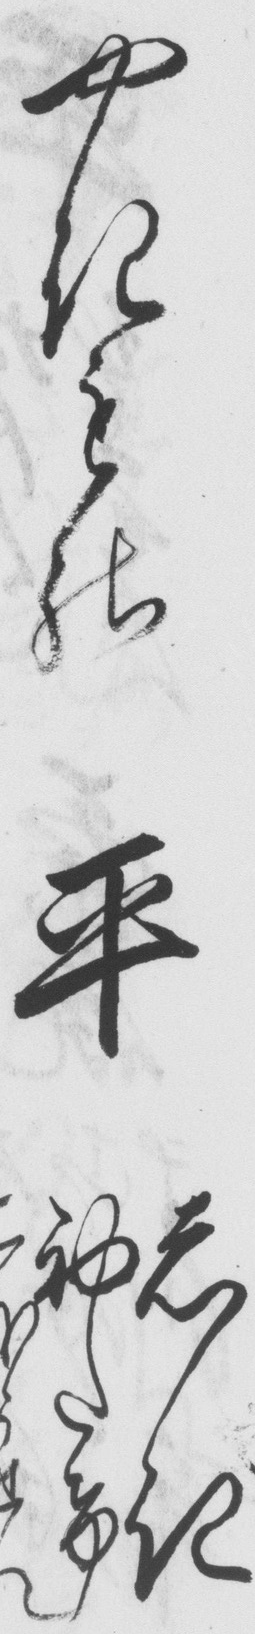やきもの平初たけ
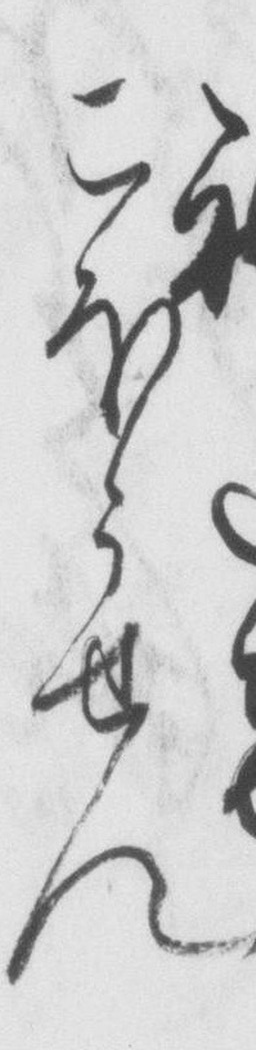こほうせん
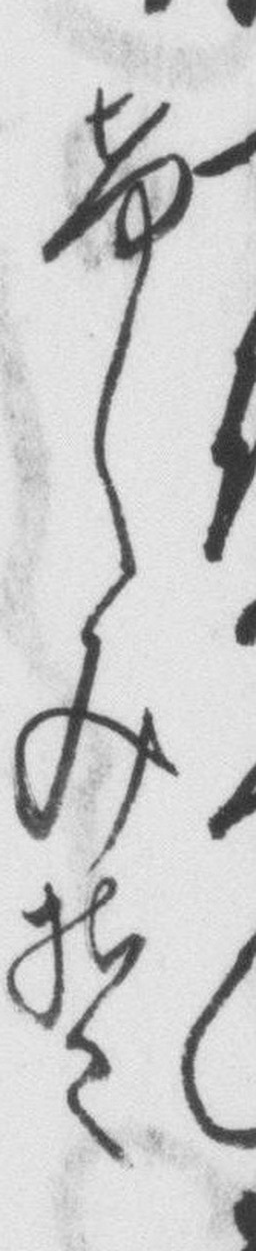けしみそ
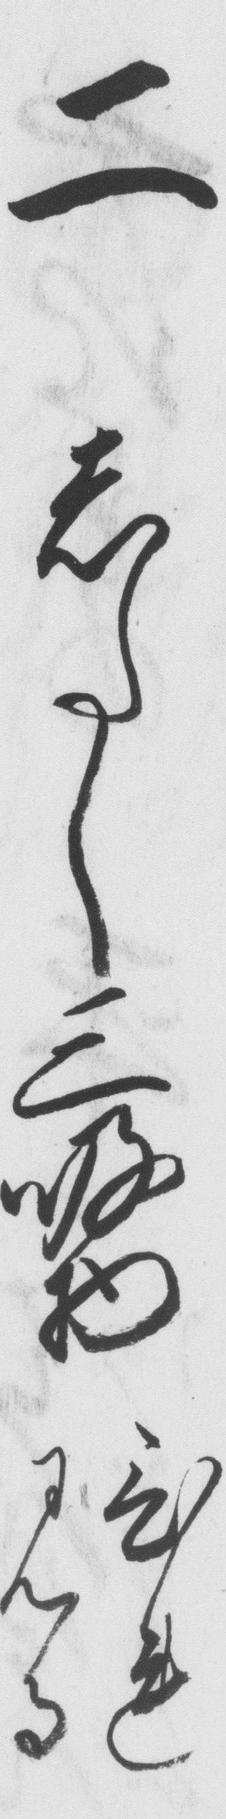二したし三吸物ひれ
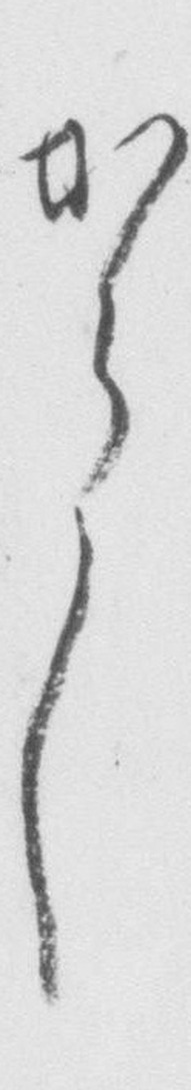からし

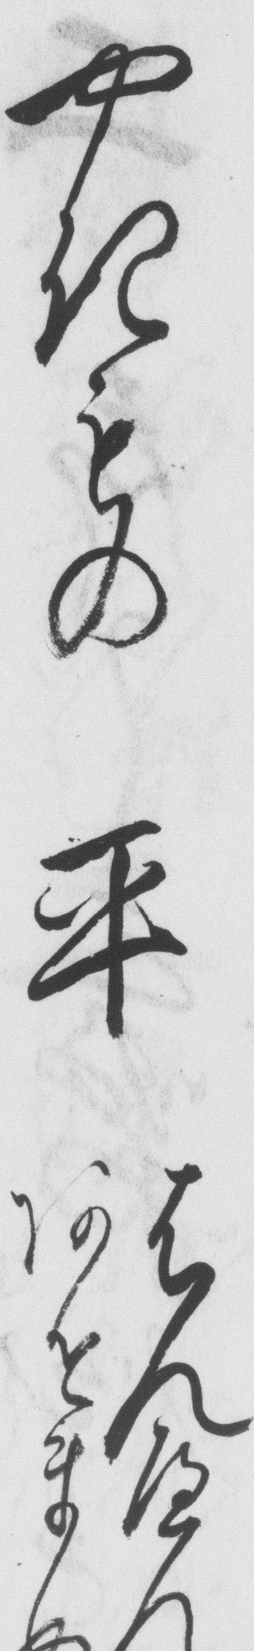やきもの平はんへん
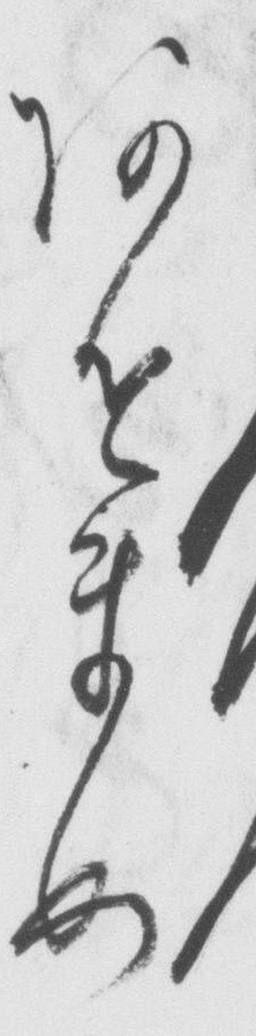あをまめ
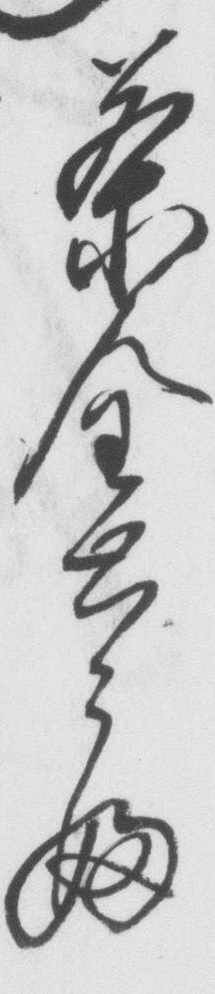茶金とうふ
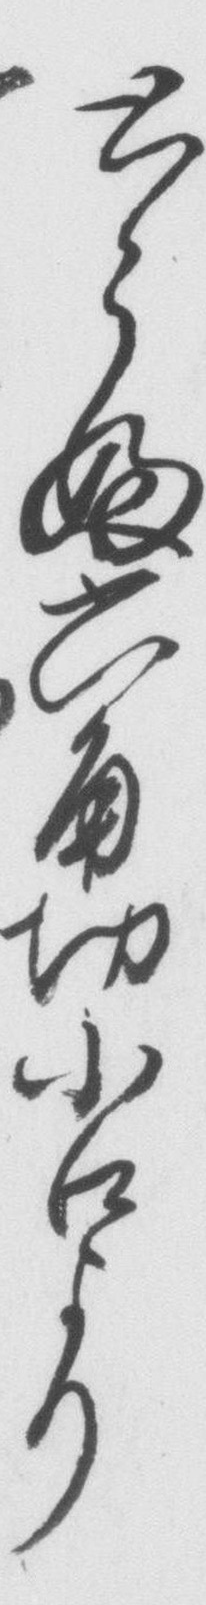とうふ六角切小口より
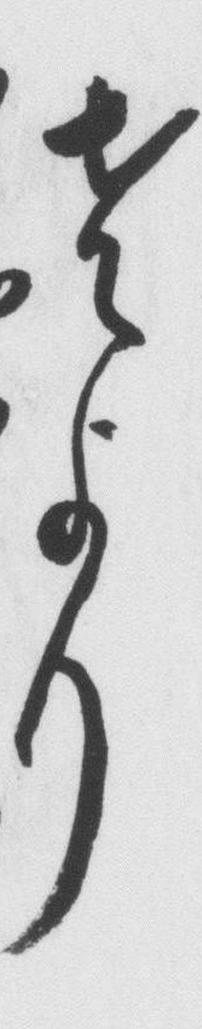さより
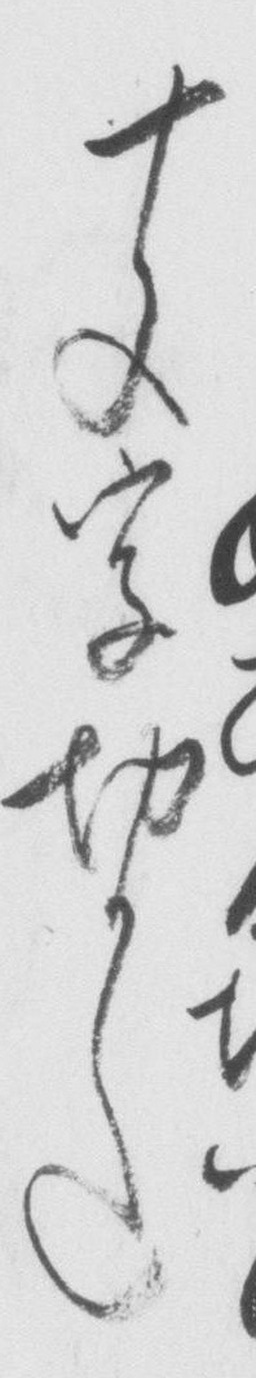十文字切かた
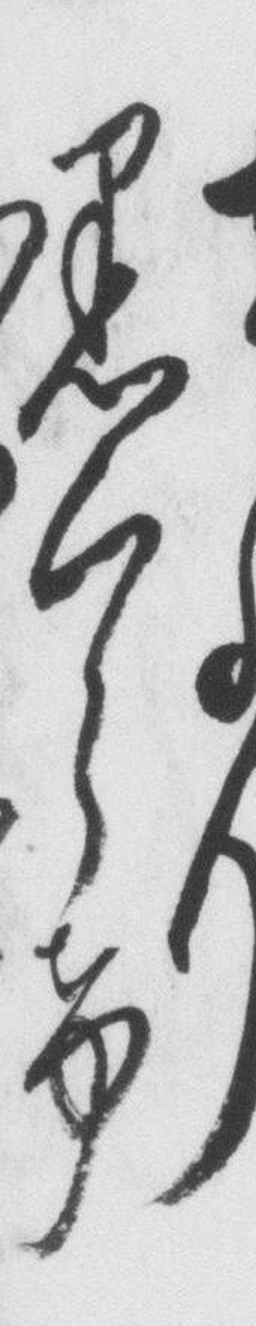黒くらけ
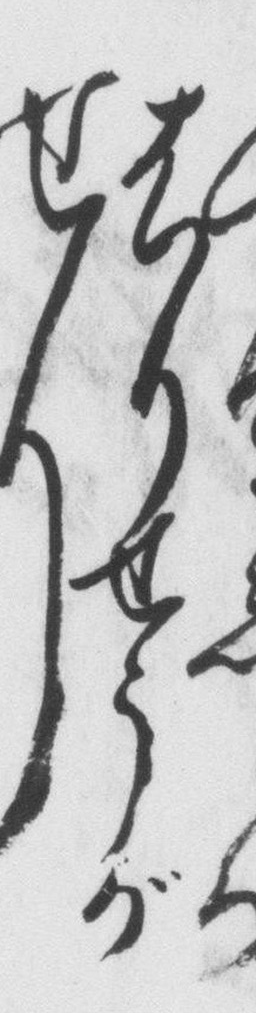はりせうが
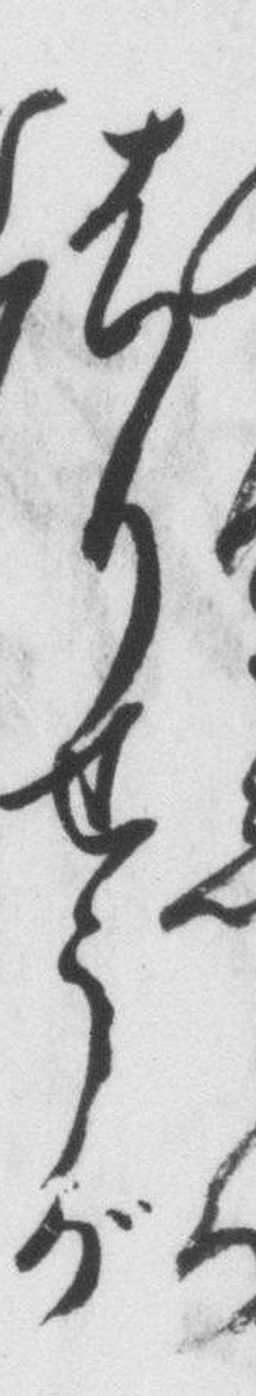はりせうが
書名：料理筌
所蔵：大阪府立大学学術情報センター 国文学研究資料館
